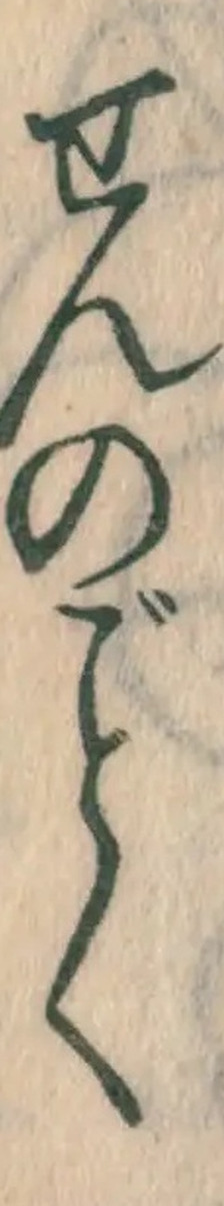せんのごとく

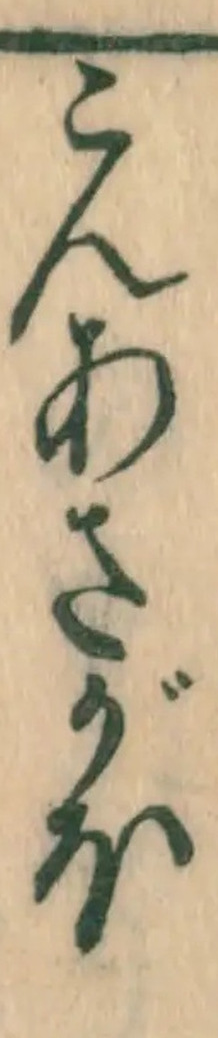こんあさがほ
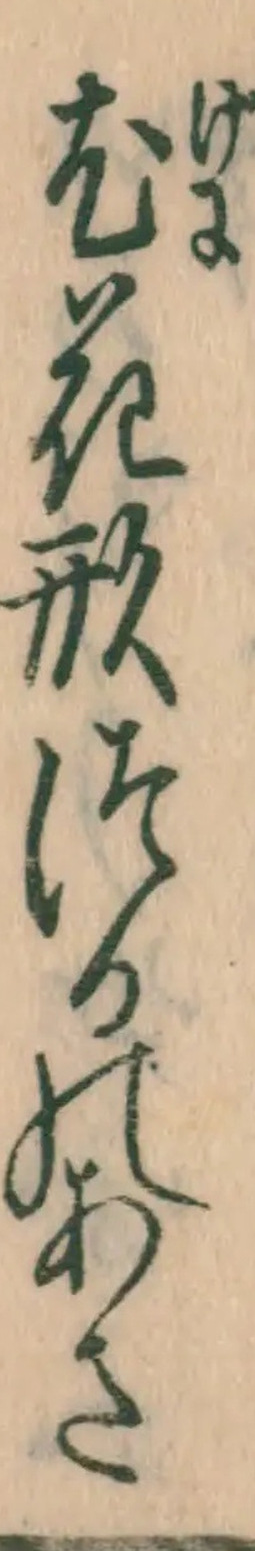尤花形つるのあさ
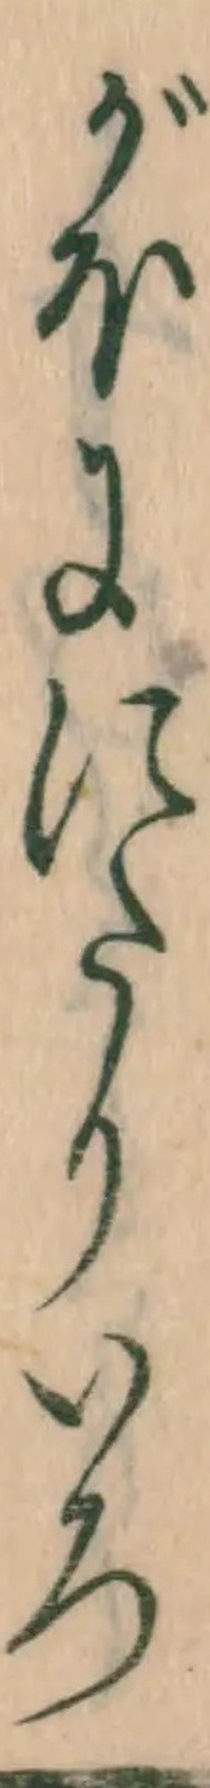がほににたりいろ
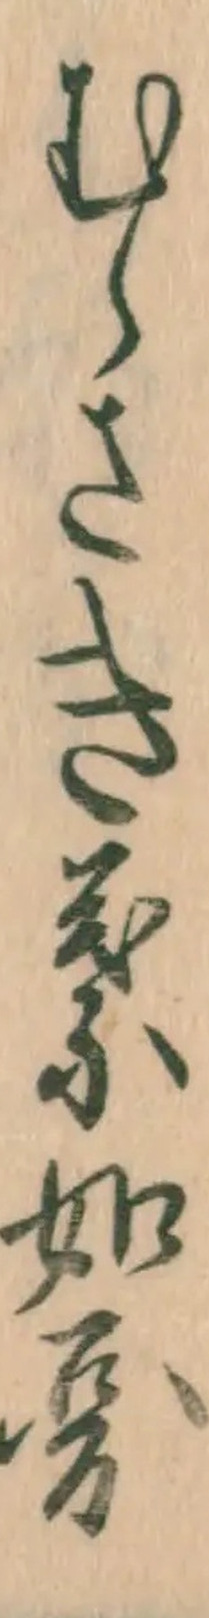むらさき葉如図
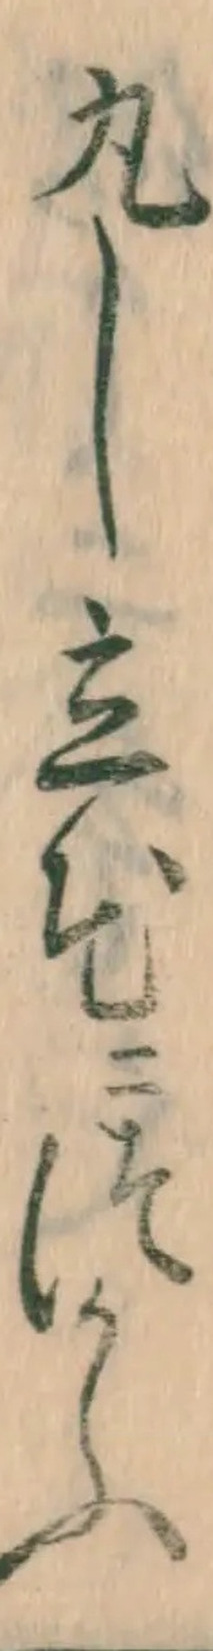丸し立花
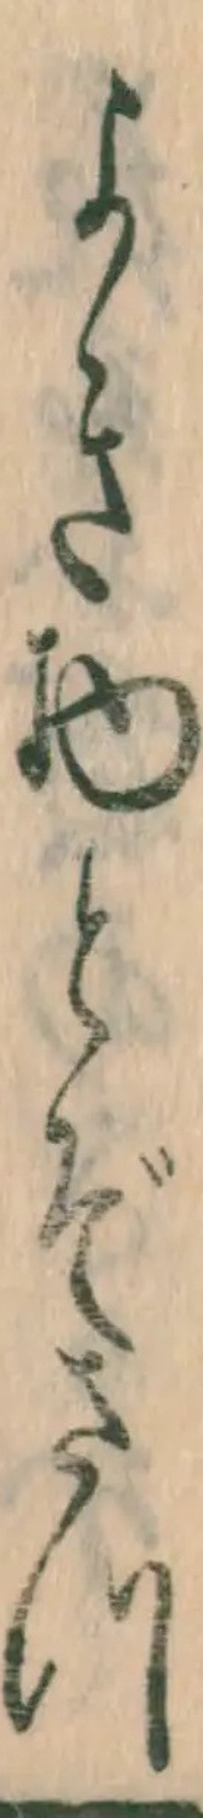よき物とぞさつ
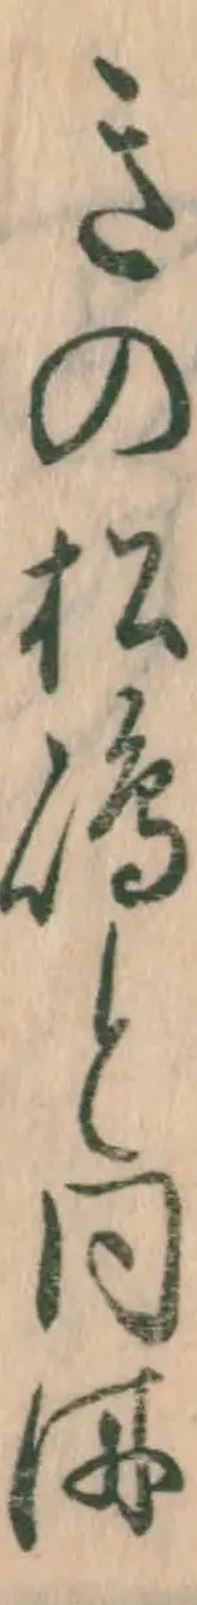きの松嶋と同時
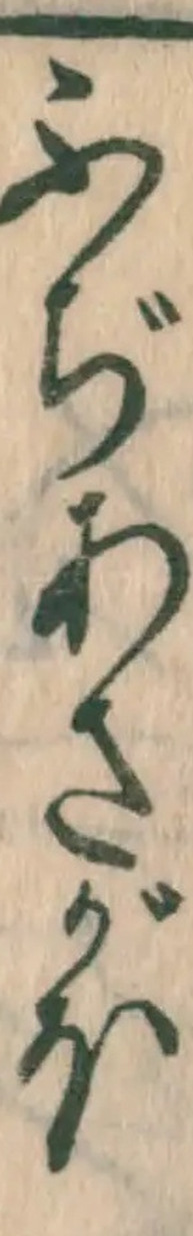ふぢあさがほ
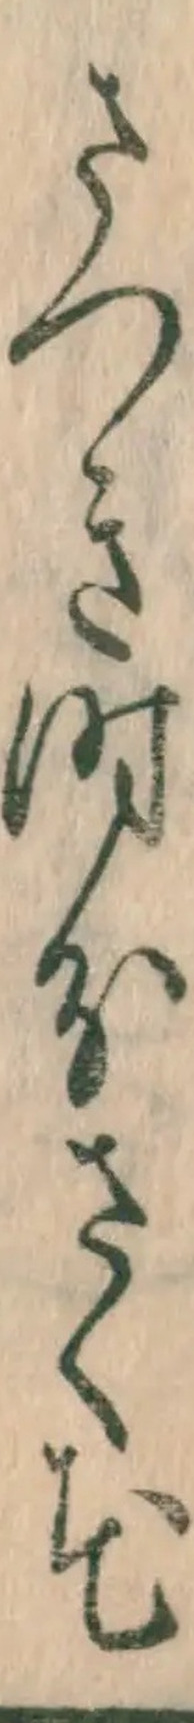さつき時分さく花
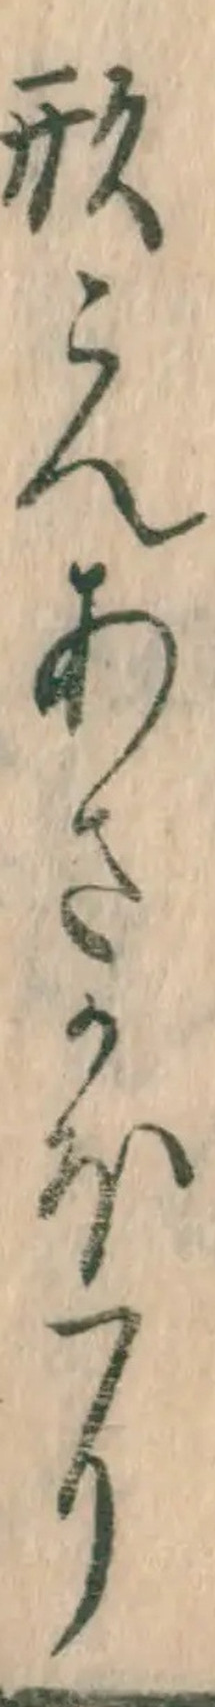形こんあさかほに
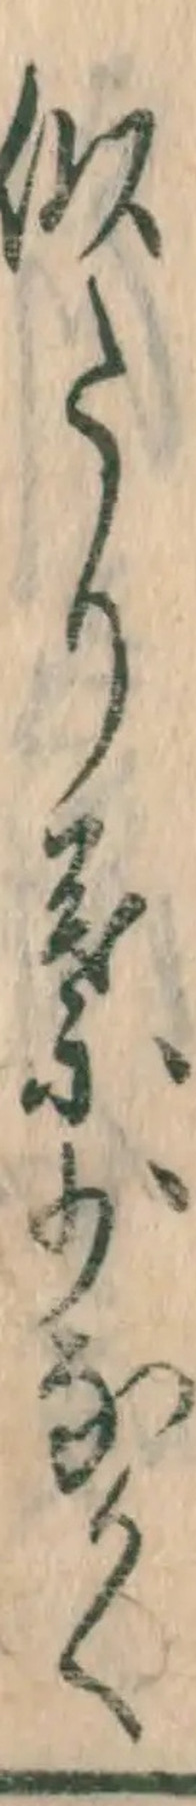似たり葉少なく
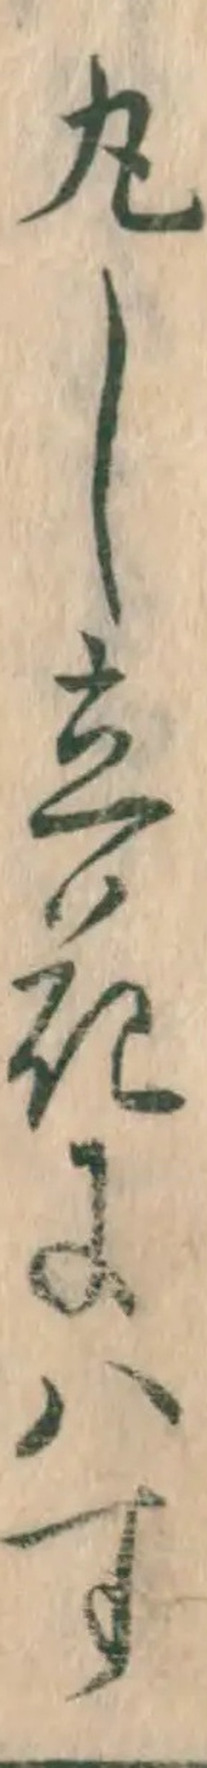丸し立花にはす
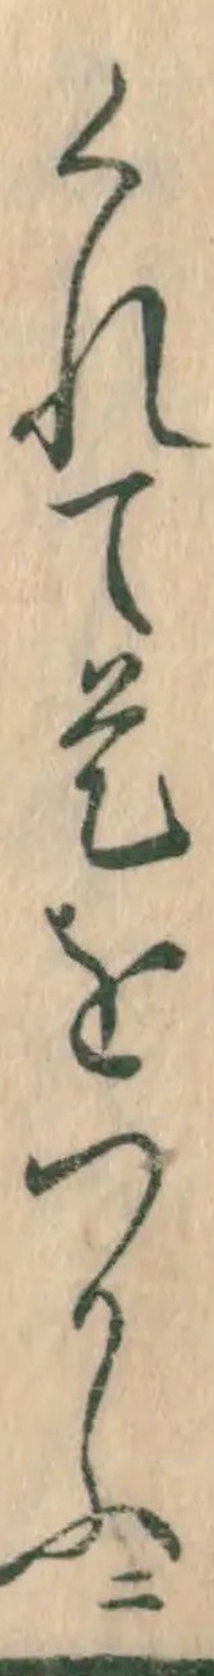くれて是をつかふ
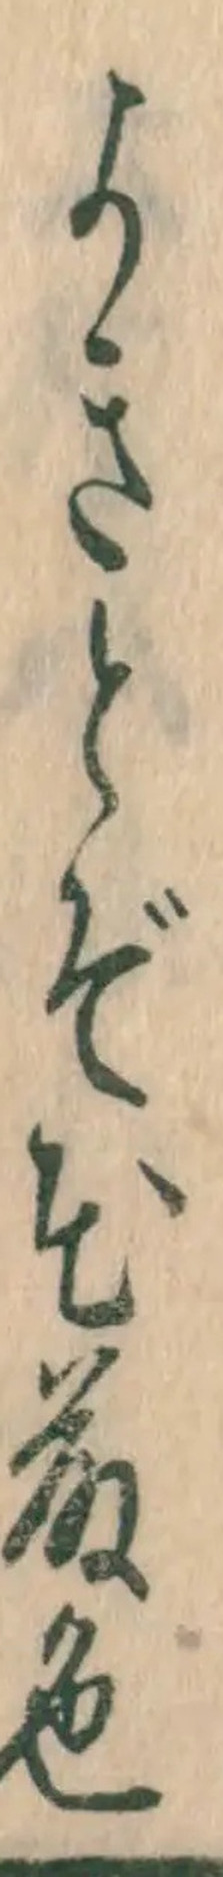よきとぞ花藤色

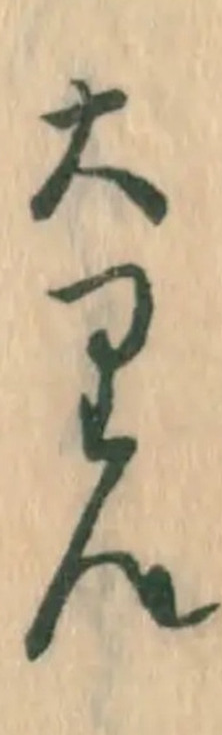大りん
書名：錦繍枕 5巻. [2]
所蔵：国立国会図書館 National Diet Library, JAPAN
